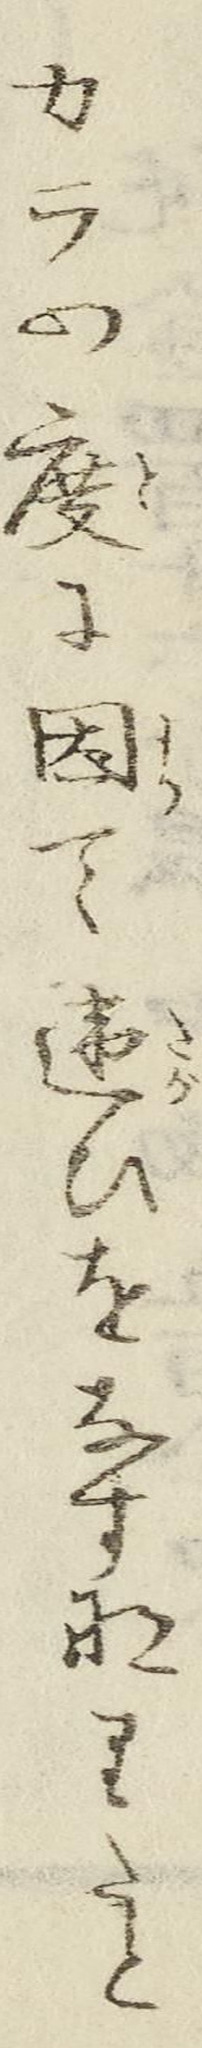カラの度に因て違ひをなすなりたと
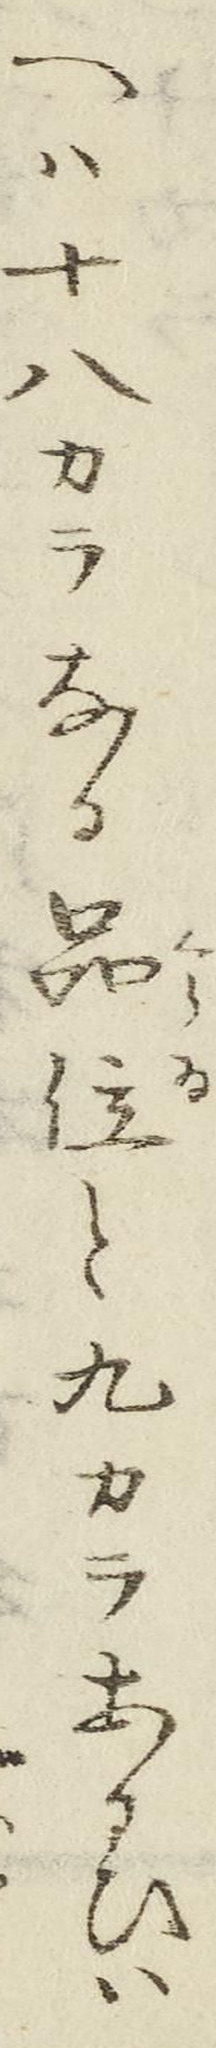へは十八カラなる品位と九カラあるひは
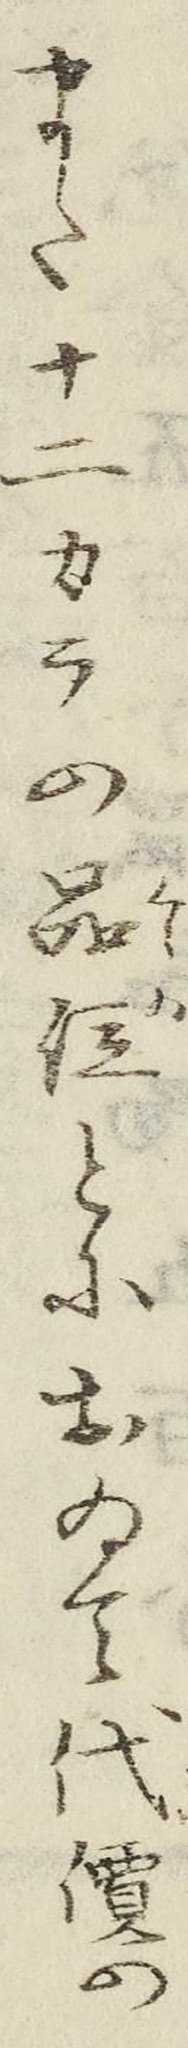また十二カラの品位とにおゐて代価の
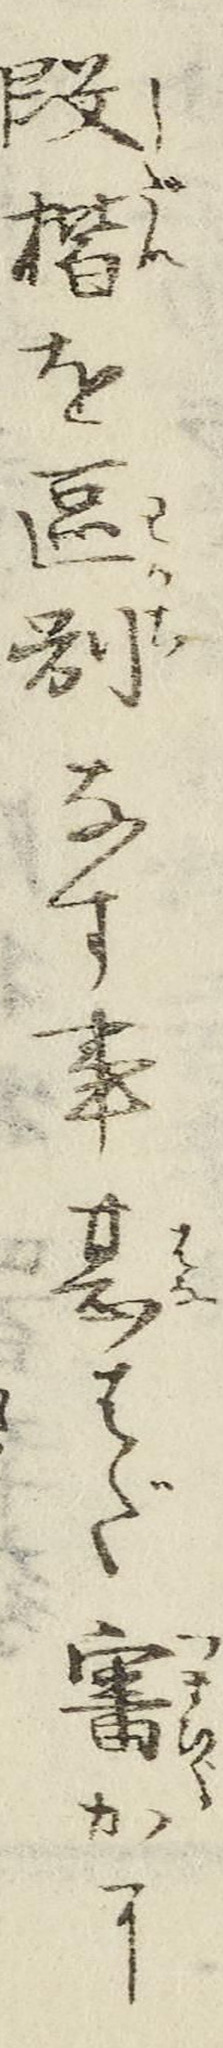叚楷を区別なす事甚はだ審かに
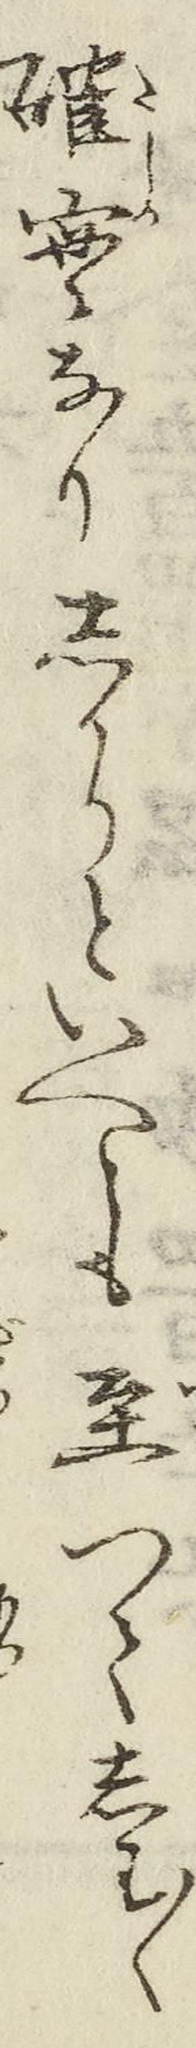確実なりしかりといへとも至つてしは〳〵
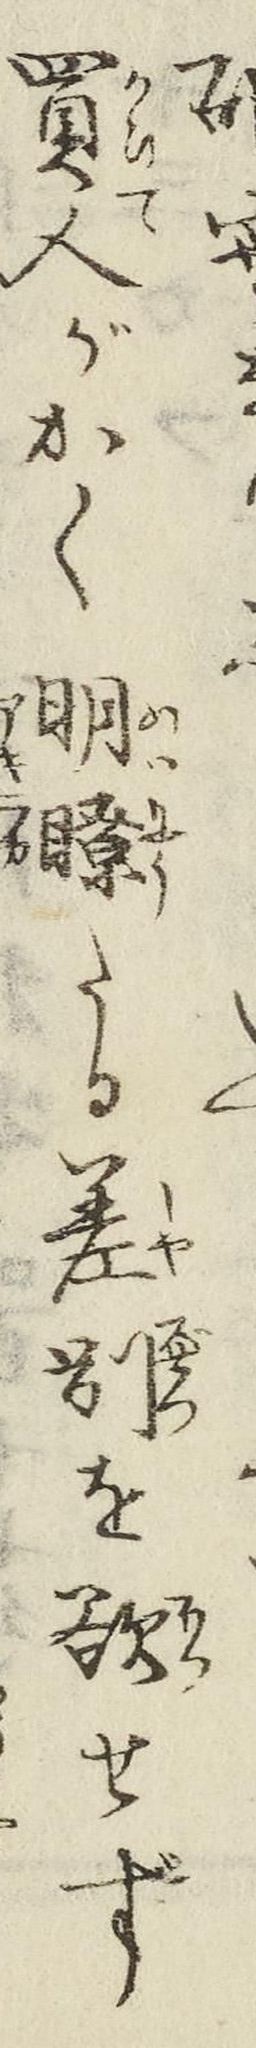買人がかく明瞭たる差別を欲せず
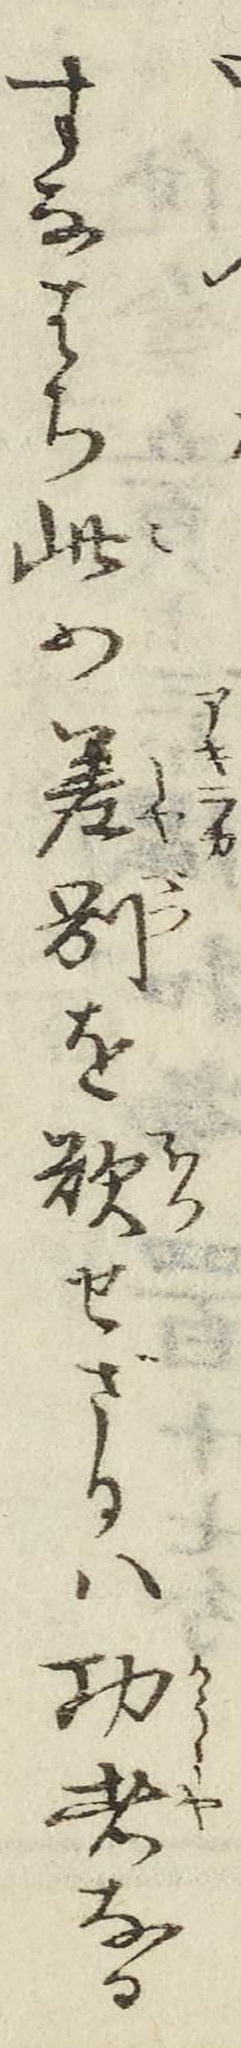すなはち此の差別を欲せざるは功者なる
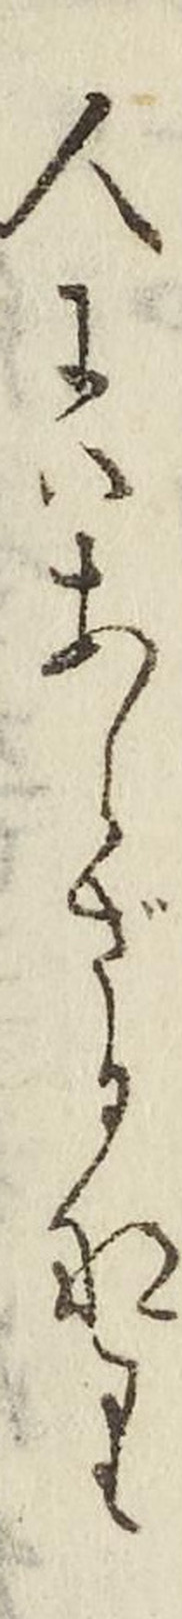人にはあらざるなり
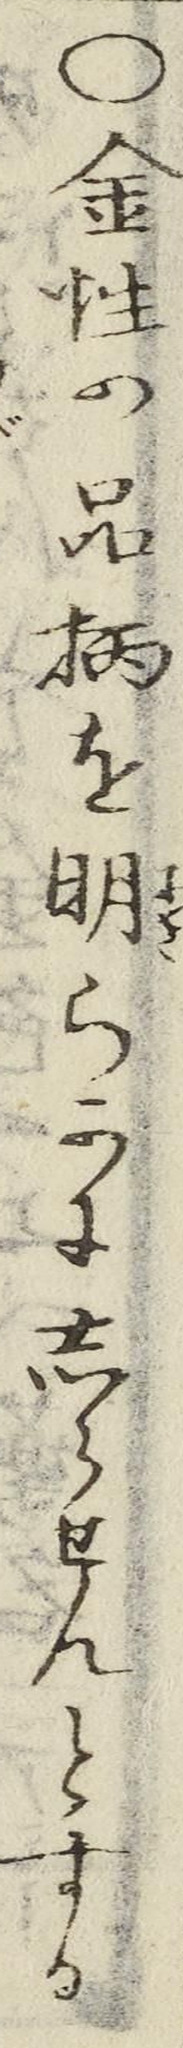○金性の品柄を明らかにしらせんとする
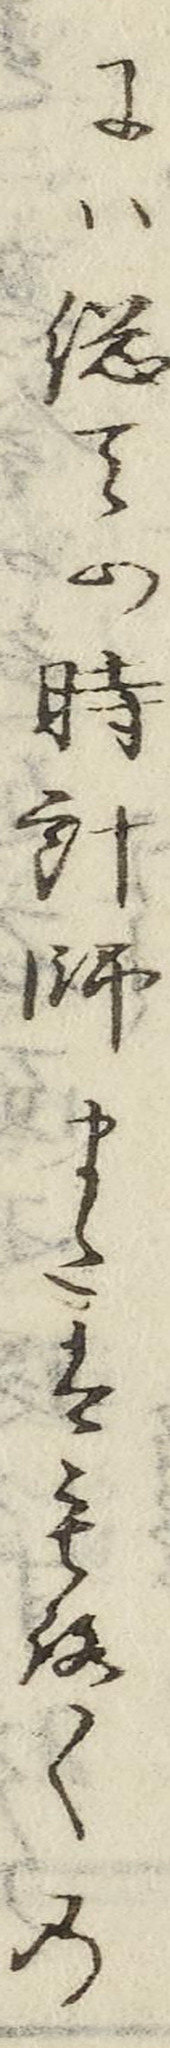には総ての時計師またはもろ〳〵の
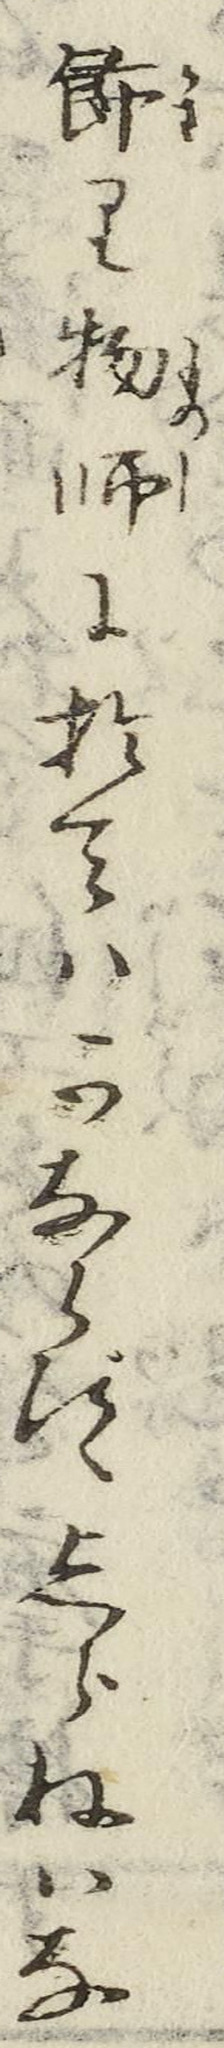飾り物師に於てはかならすしらねはな
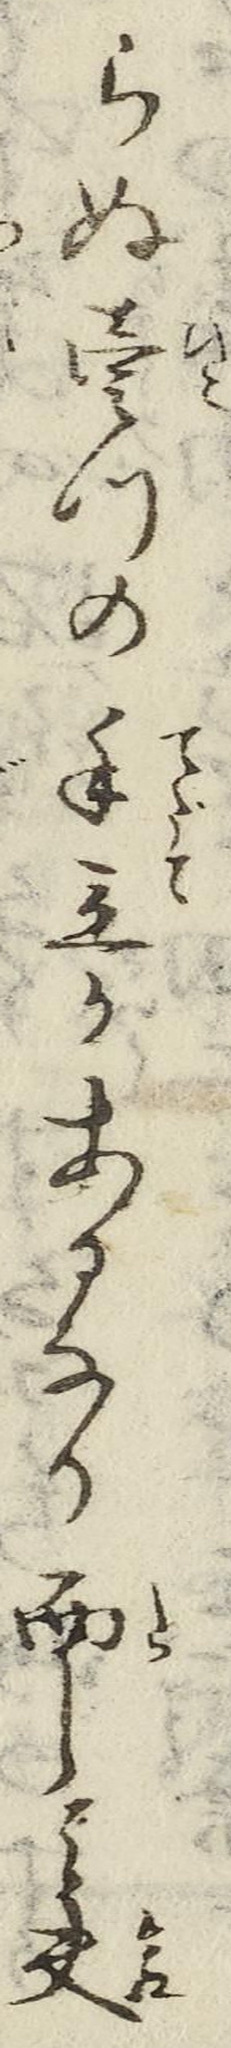らぬ壹つの手立かあるなり而して夫
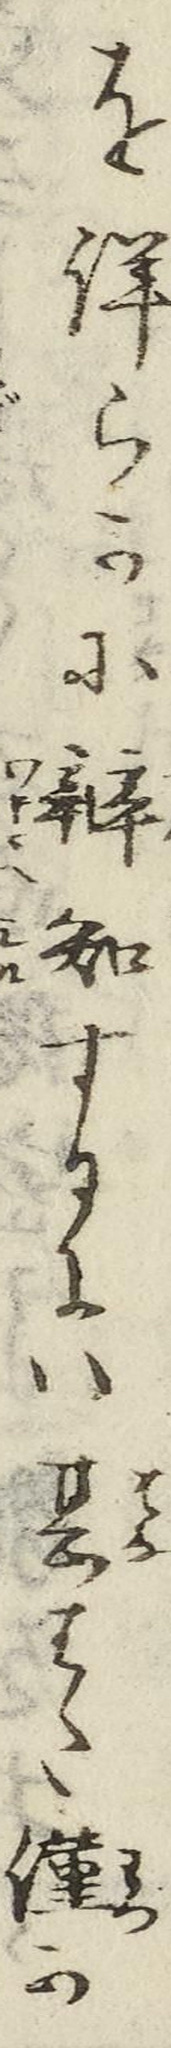を詳らかに弁知するには甚はた僅か
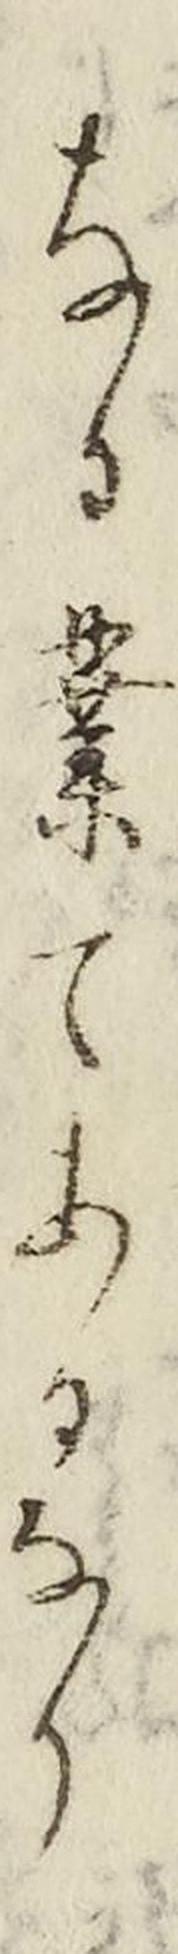なる業てあるなり
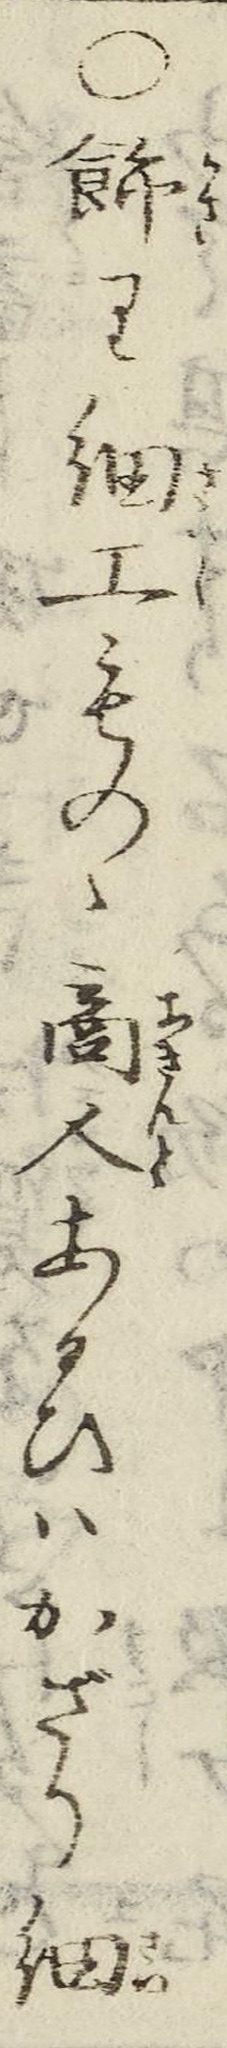○飾り細工ものゝ商人あるいはかざり細
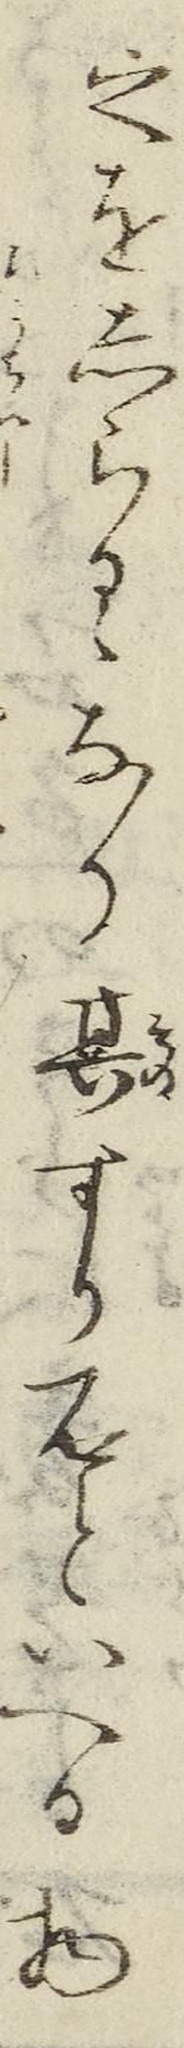之をしらるゝなり其すり石といへる物
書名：[時計に関する冊子]
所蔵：東京大学地震研究所図書室 Earthquake Research Institute Library, The University of Tokyo, JAPAN
